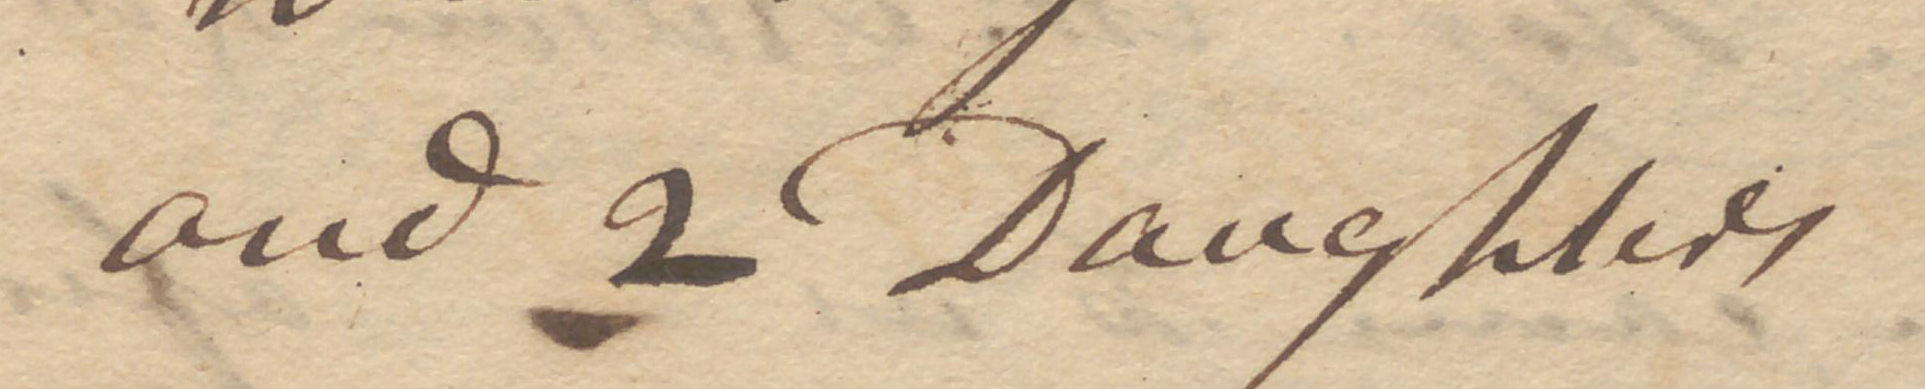and 2 Daughters
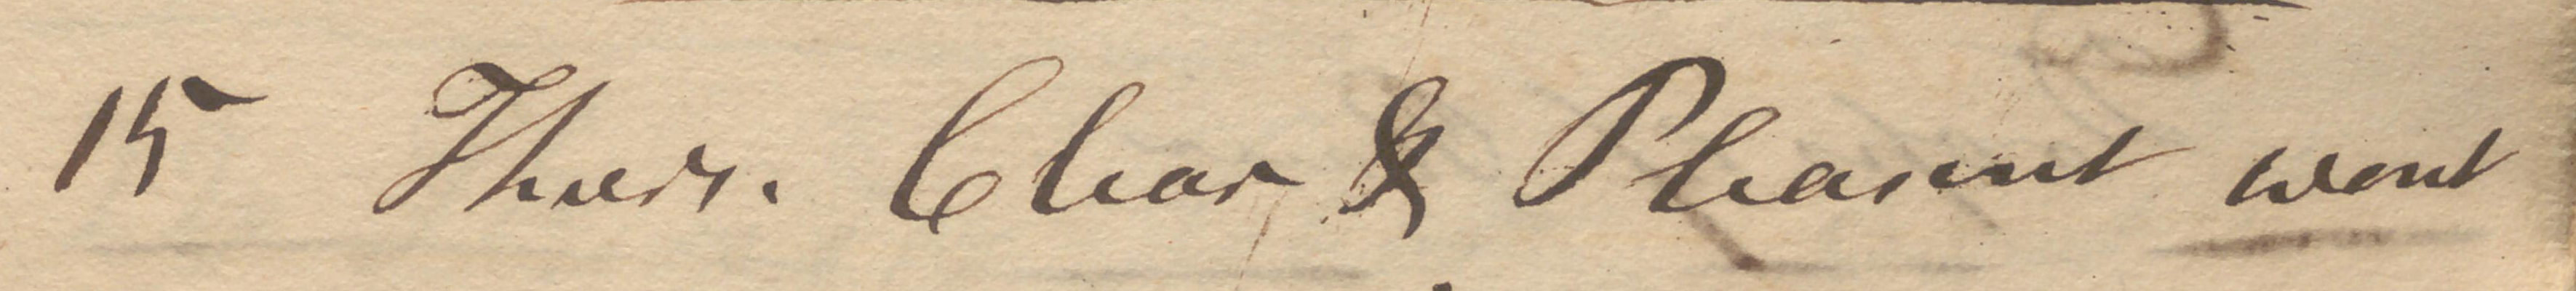15 Thurs^t. Clear & Pleasent went
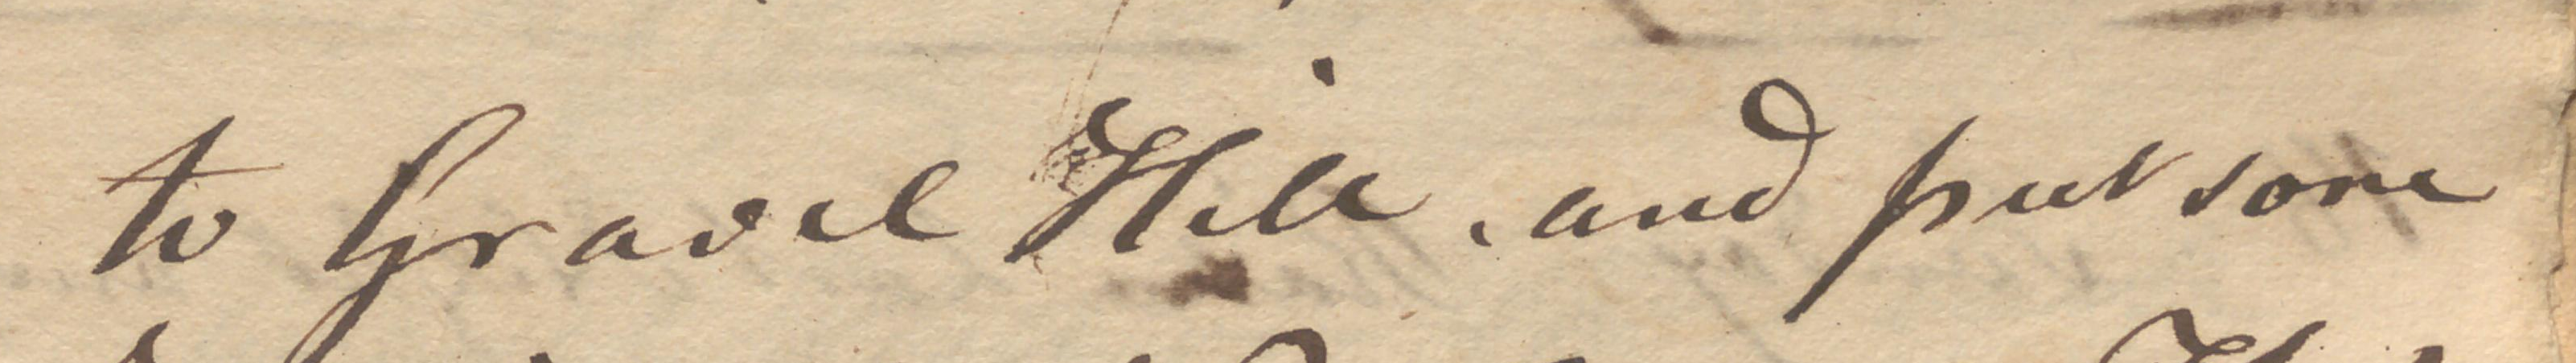to Gravel Hill, and put some
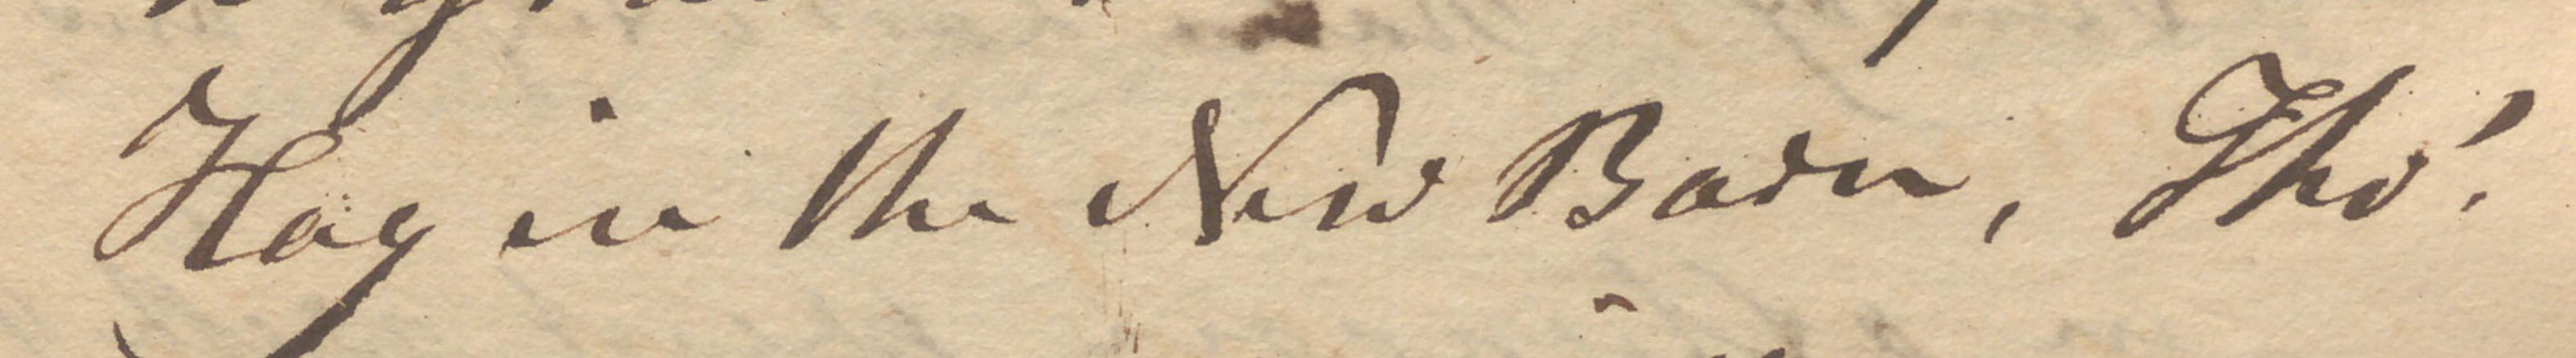Hay in the New Barn, Tho^s.
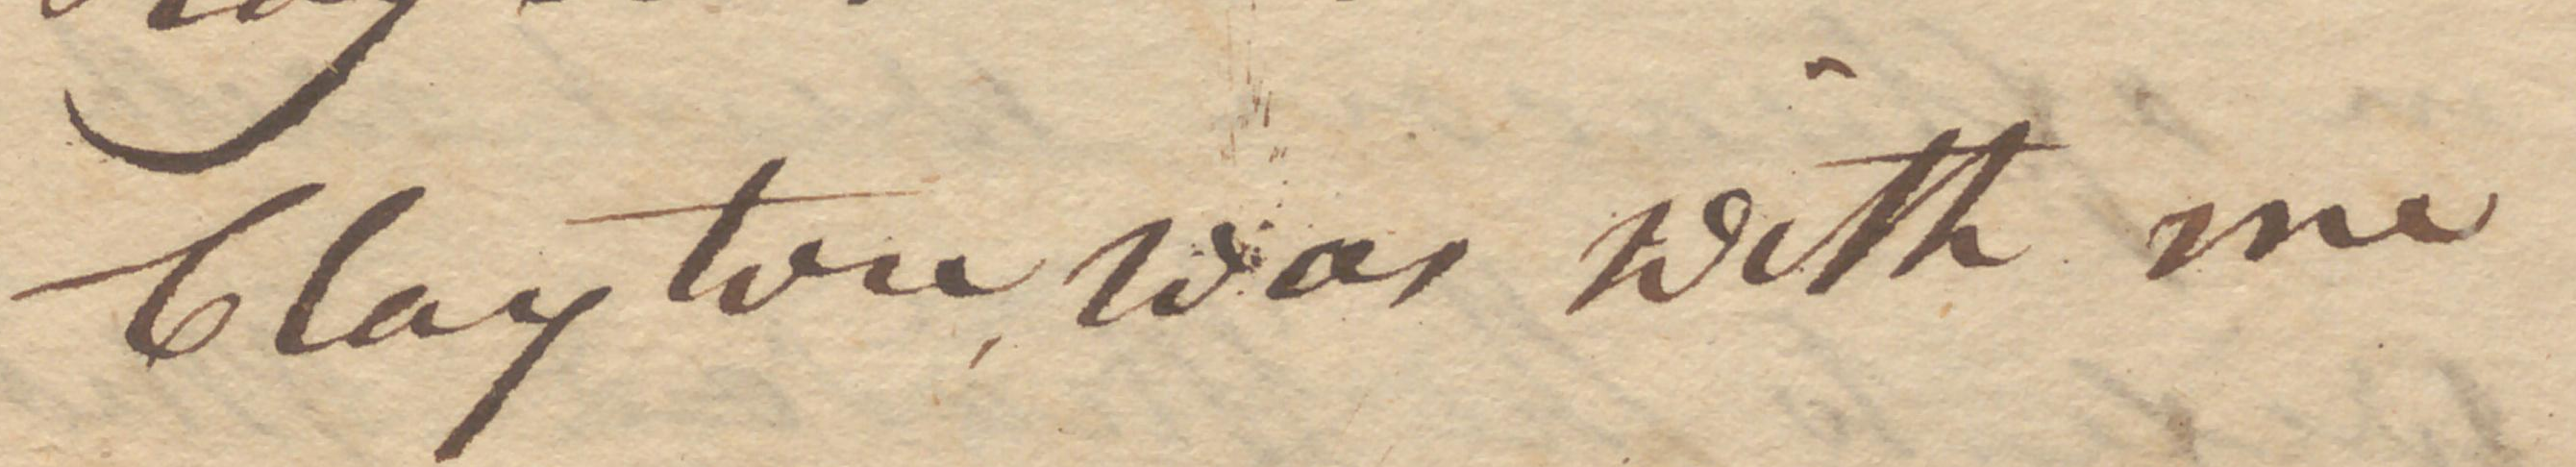Clayton was with me
